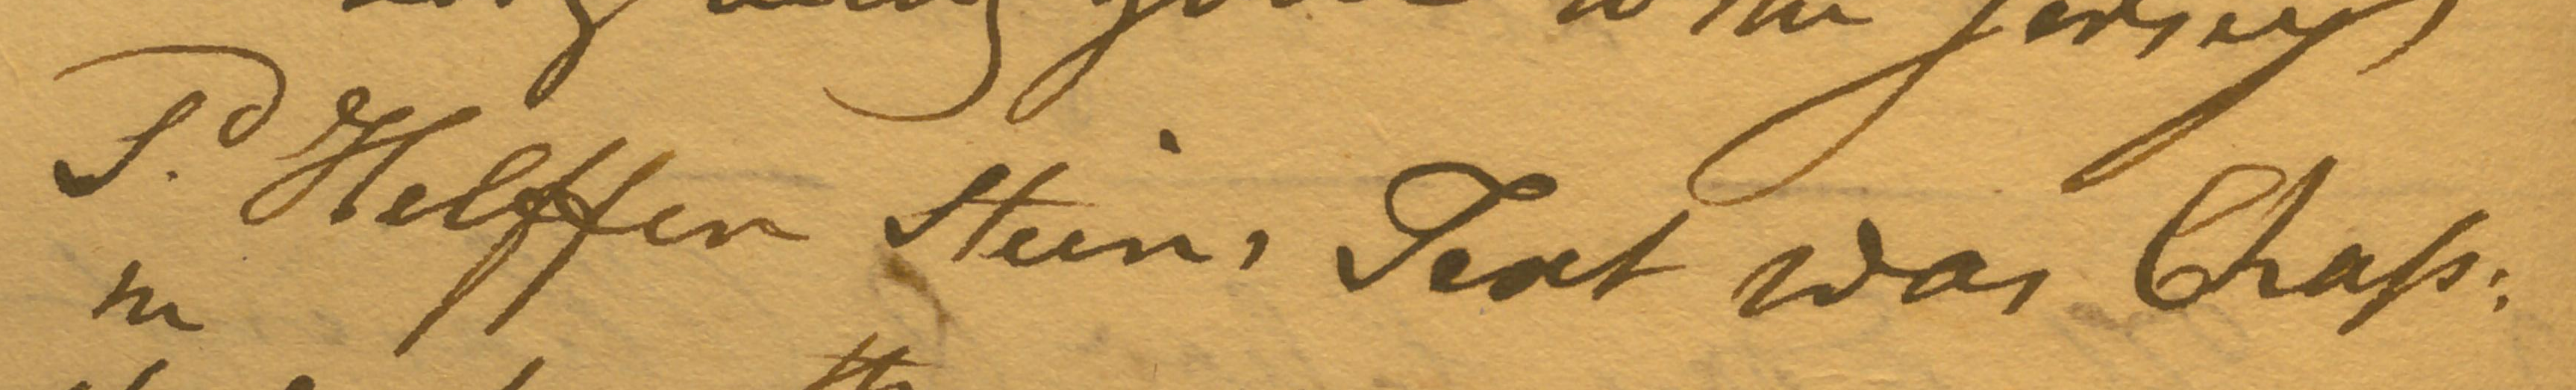s^d. Helffen Steins Text was Chap:
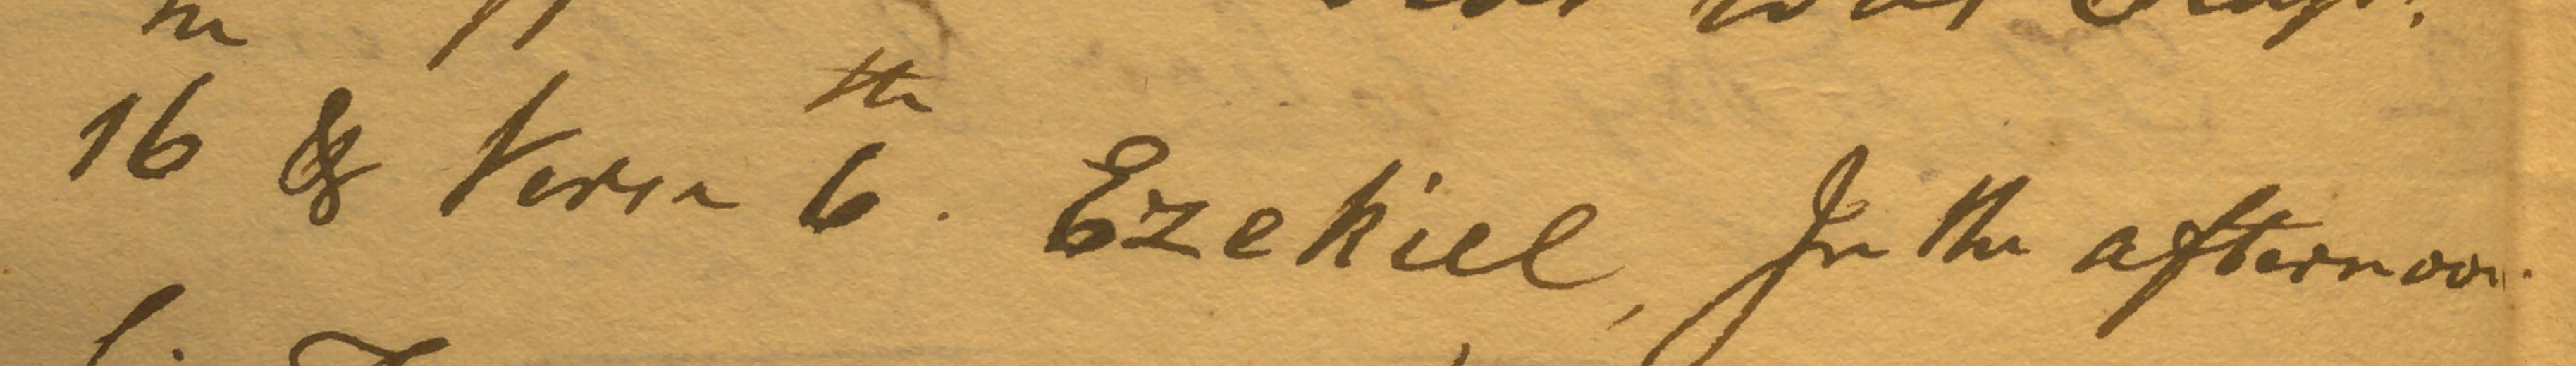16^th & Verse 6^th. Ezekiel, In the afternoon
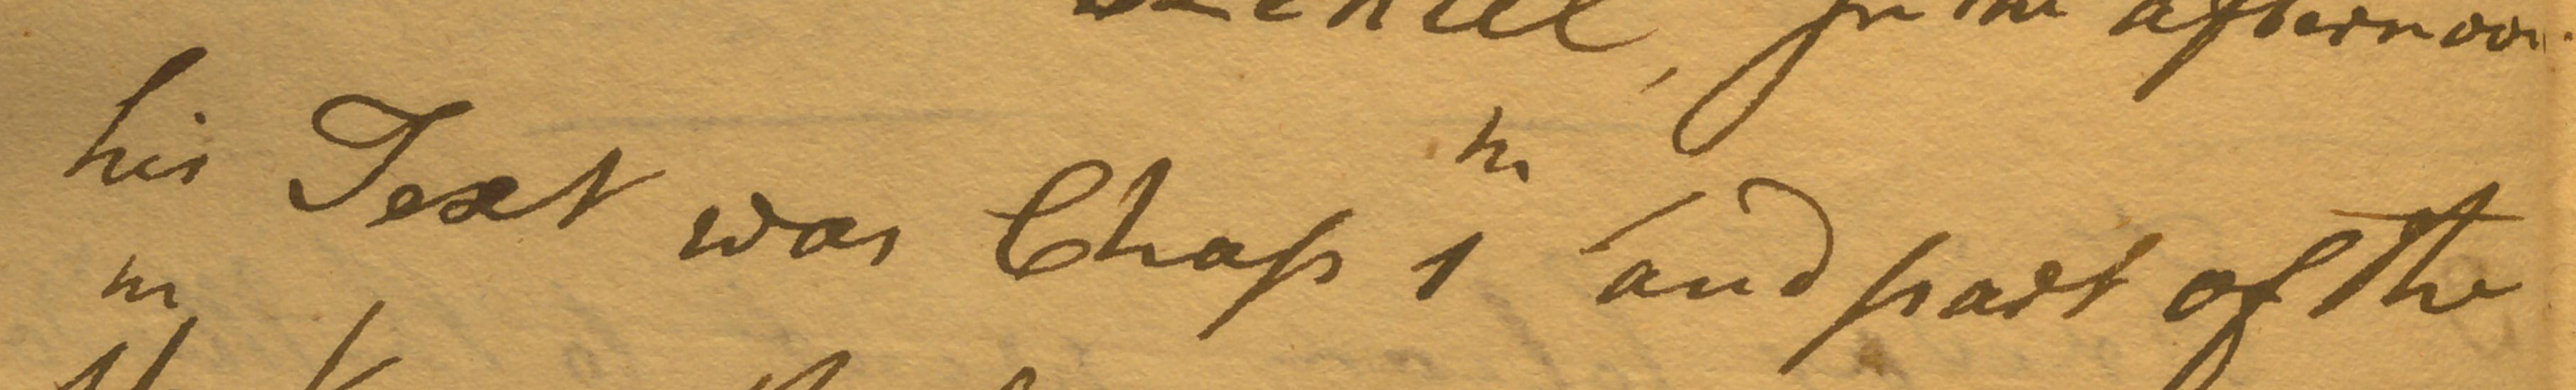his Text was Chap 1^th and part of the
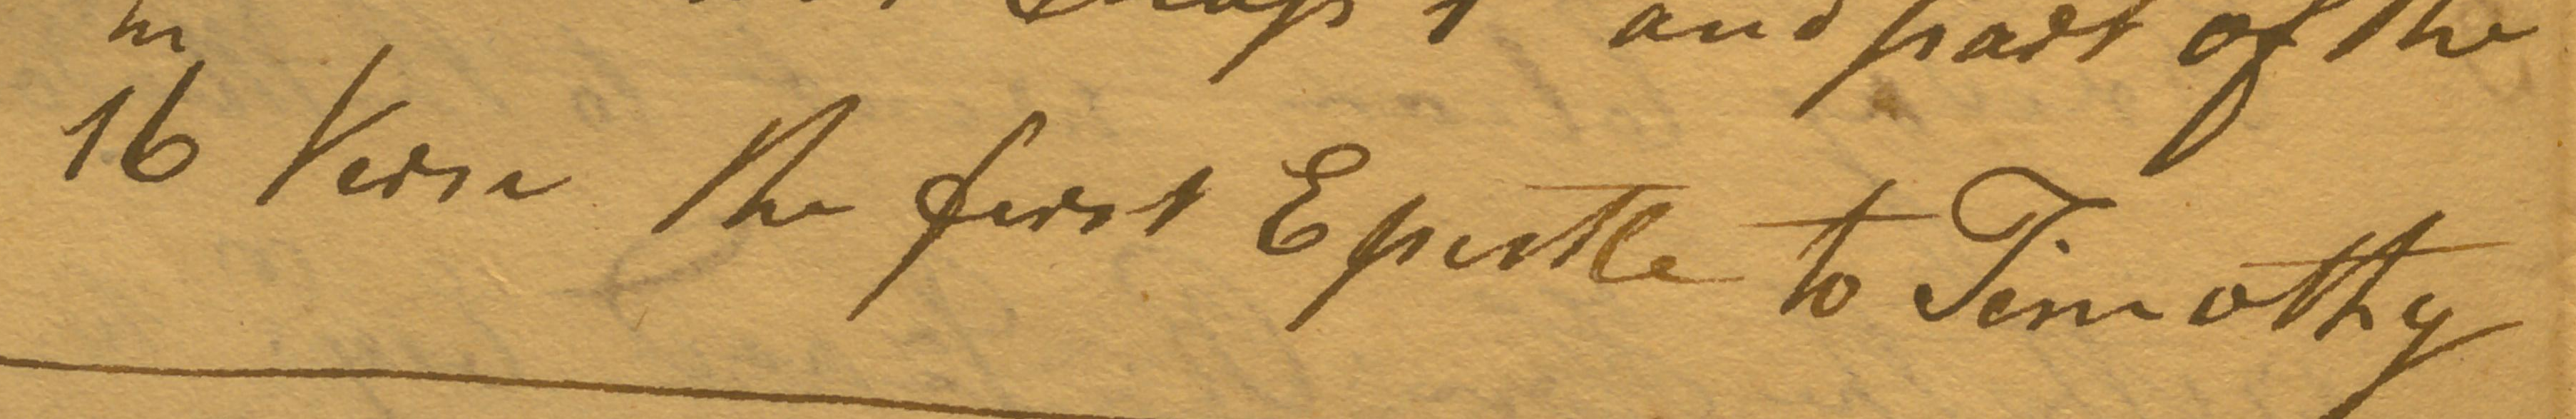16^th Verse the first Epistle to Timothy
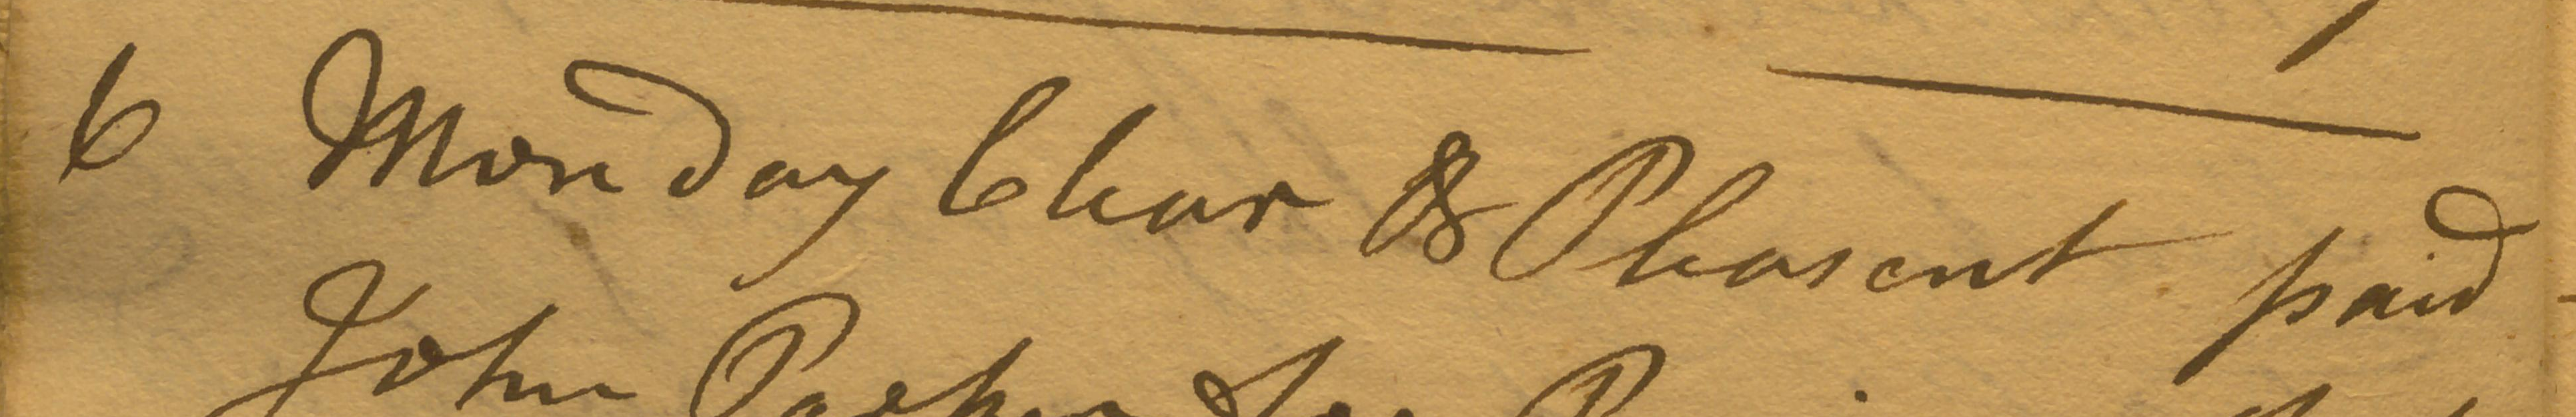6 Monday Clear & Pleasent paid
